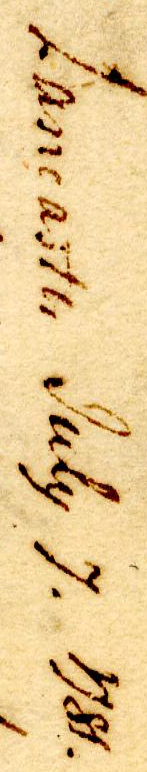Lancaster July 7. 1781.
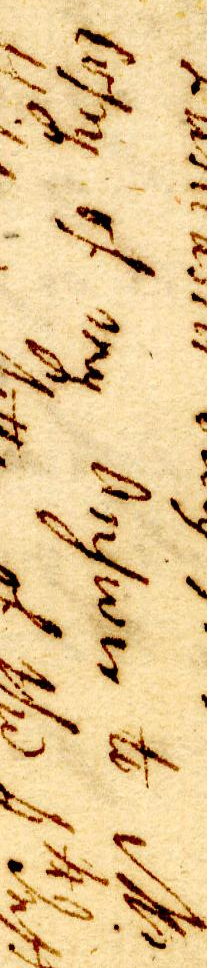Copy of my Answer to M^r.
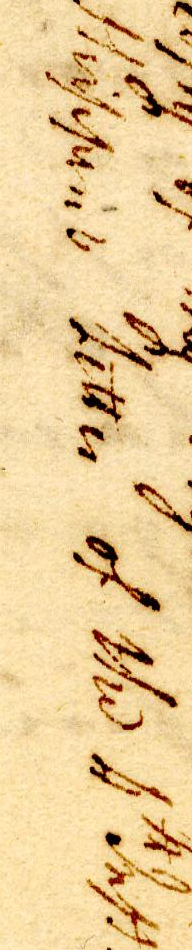Shippen's Letter of the 4^th Inst.
